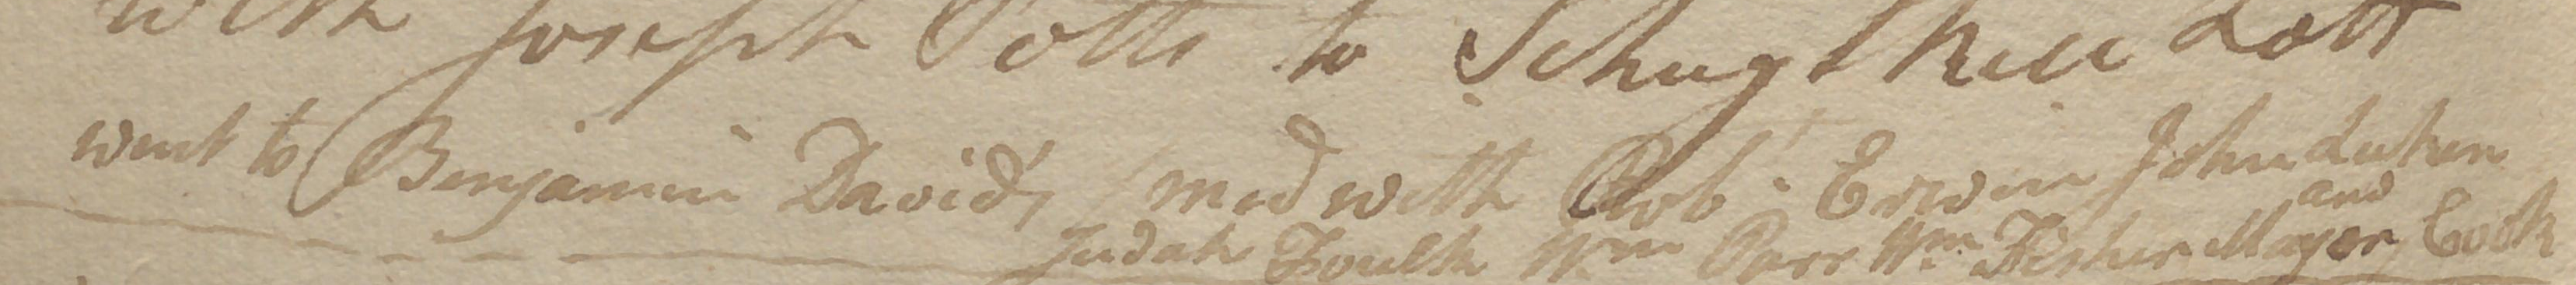went to Bengamin David's med with Rob^t. Erwin John Luken
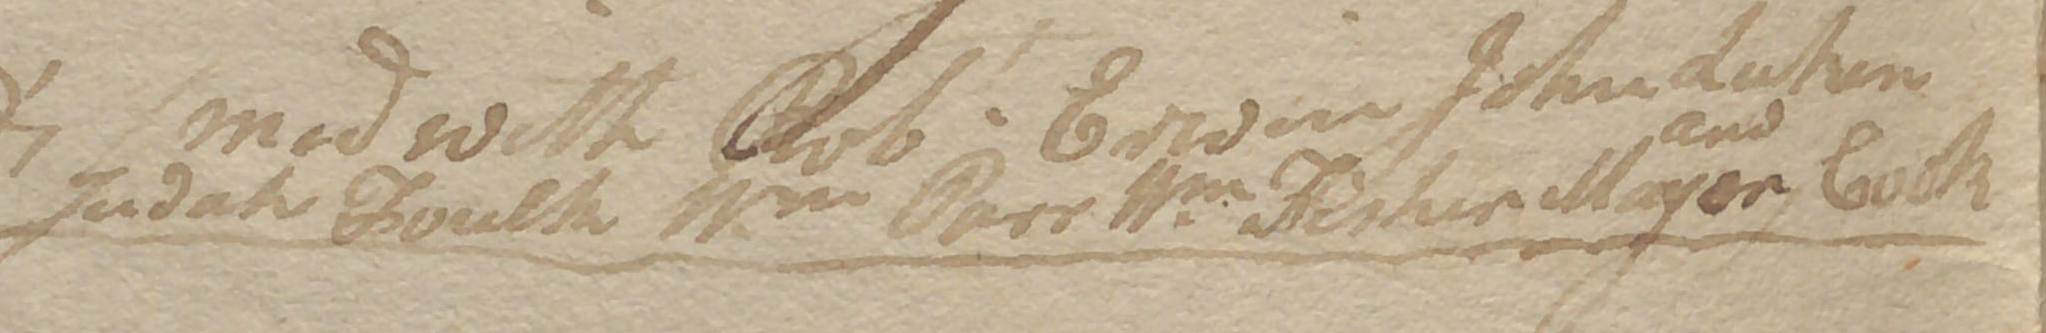Judah Foulk W^m Parr W^m. Fisher Major Cook
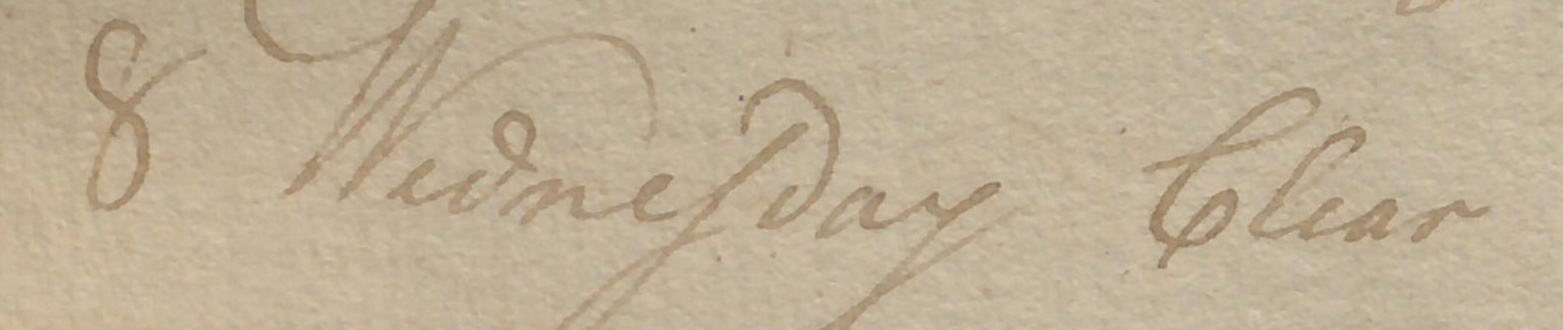8 Wednesday Clear
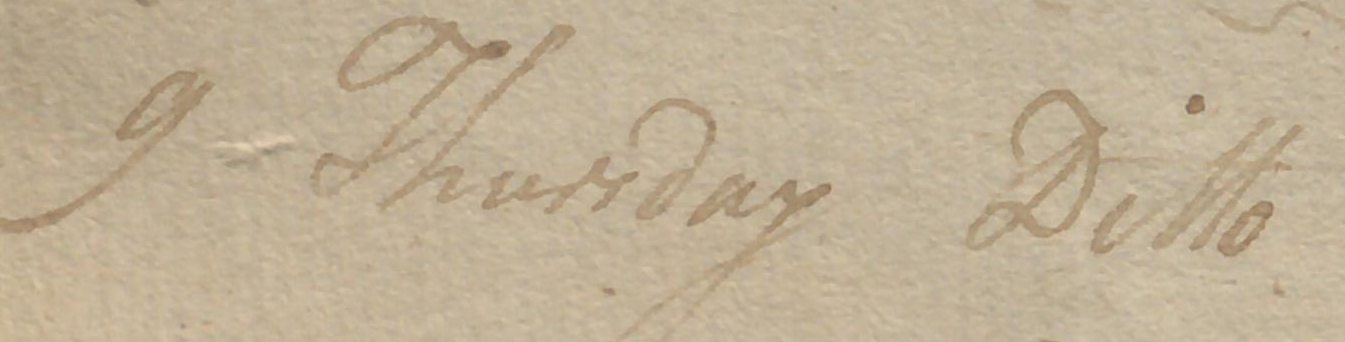9 Thursday Ditto
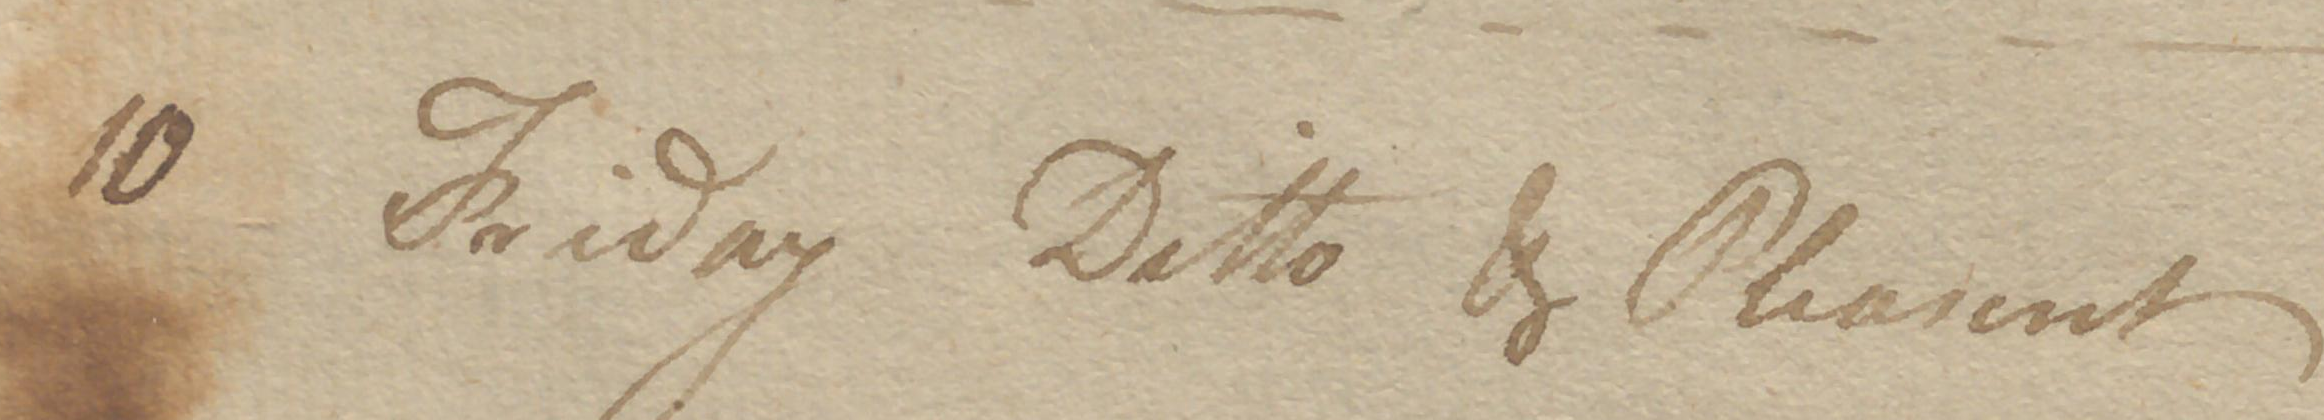10 Friday Ditto & Pleasent
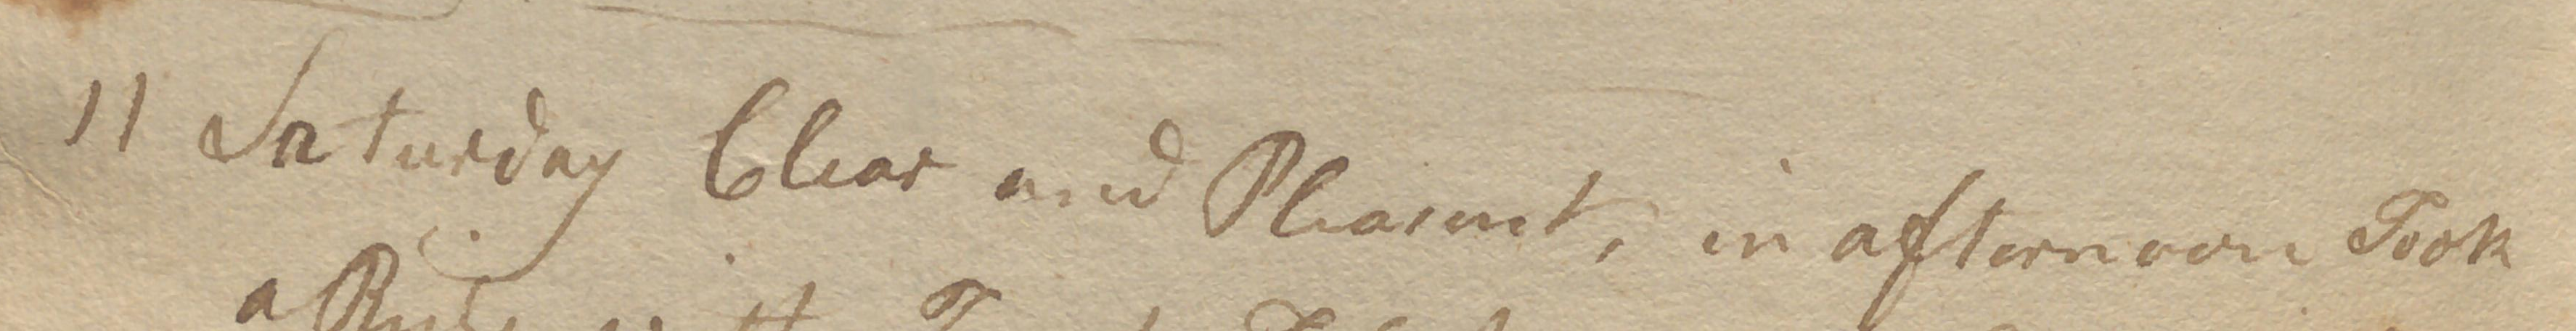11 Saturday Clear and Pleasent, in afternoon Took
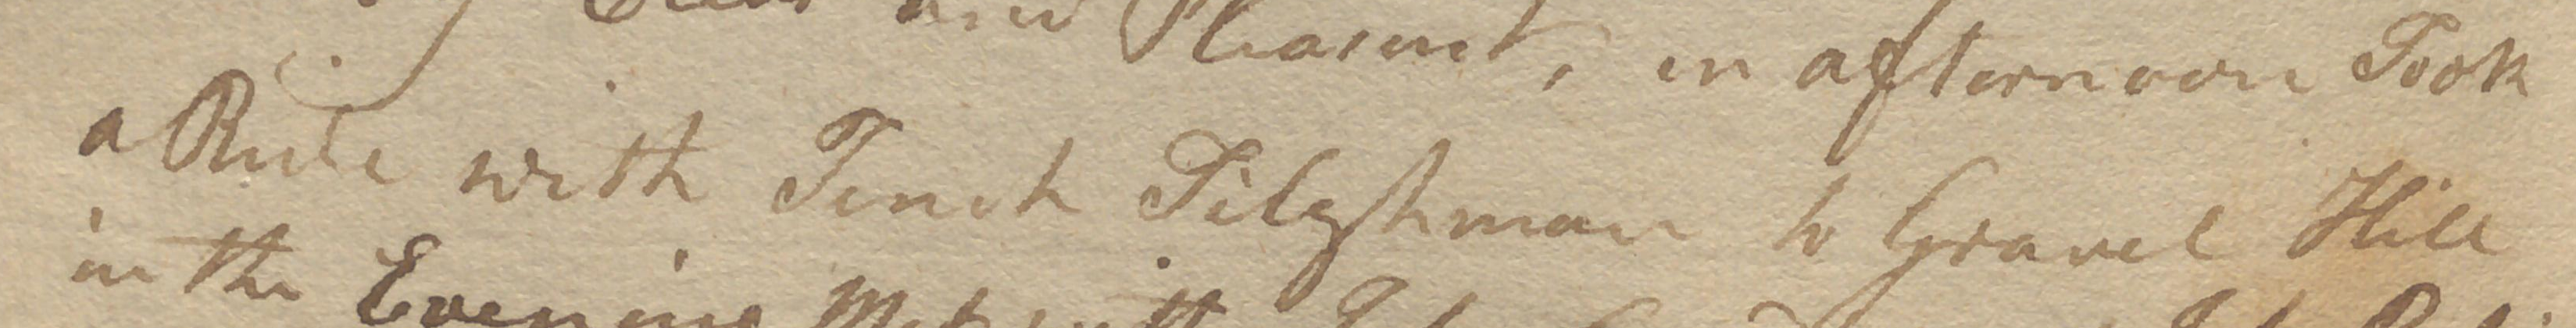a Ride with Tench Tilghman to Gravel Hill
